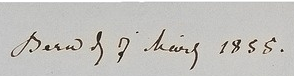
Bern den 7 März 1855.
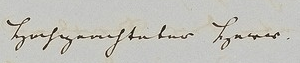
Hochgeachteter Herr.
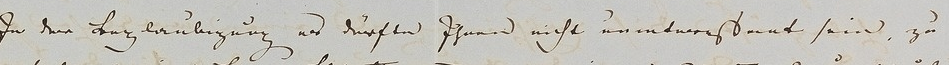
In der Beglaubigung es dürfte Ihnen nicht uninteressant sein, zu
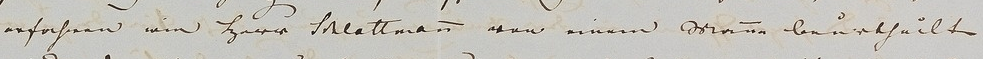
erfahren wie Herr Schlattmann von einem Manne beurtheilt
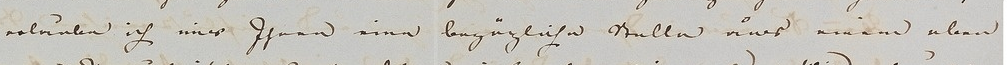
erlaube ich mir Ihnen eine bezügliche Stelle aus einem eben
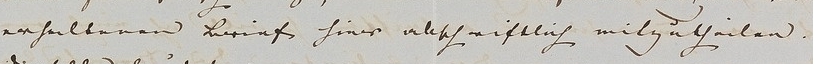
erhaltenen Brief hier abschriftlich mitzutheilen.
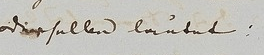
Derselbe lautet:
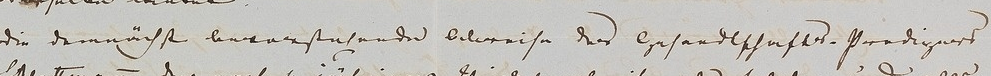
«Die demnächst bevorstehende Abreise des Gesandtschafts-Predigers
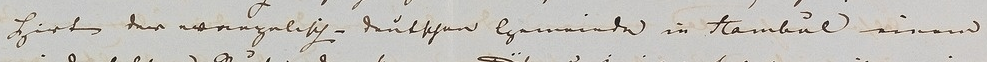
Hirte der evangelisch-deutschen Gemeinde in Stambul einem
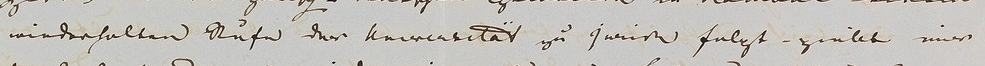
wiederholten Rufe der Universität zu Zürich folgt – giebt mir
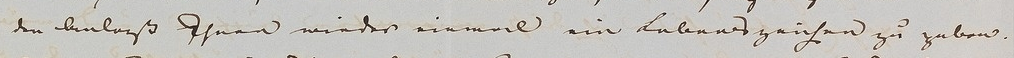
den Anlaß Ihnen wieder einmal ein Lebenszeichen zu geben.
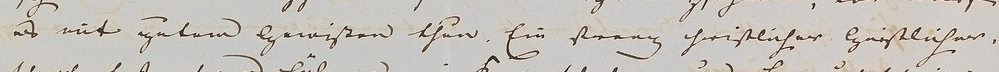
es mit gutem Gewißen thun. Ein streng christlicher Geistlicher,
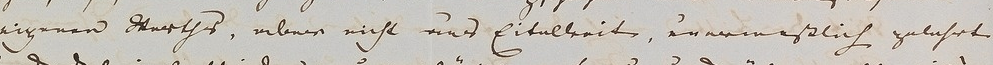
eigenen Werthes, aber nicht aus Eitelkeit, unermeßlich gelehrt
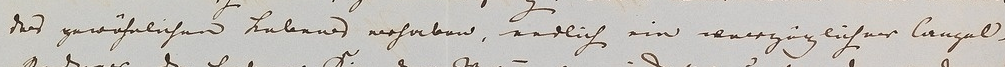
des gewöhnlichen Lebens erhaben, endlich ein vorzüglicher Canzel-
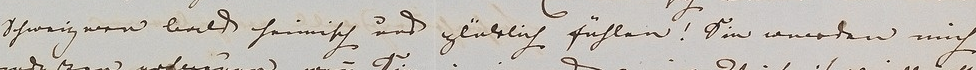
Schweizern bald heimisch und glüklich fühlen! Sie werden mich
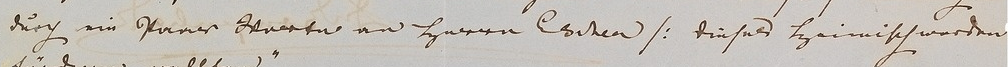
durch ein Paar Worte an Herrn Escher: ) dieses Heimischwerden
